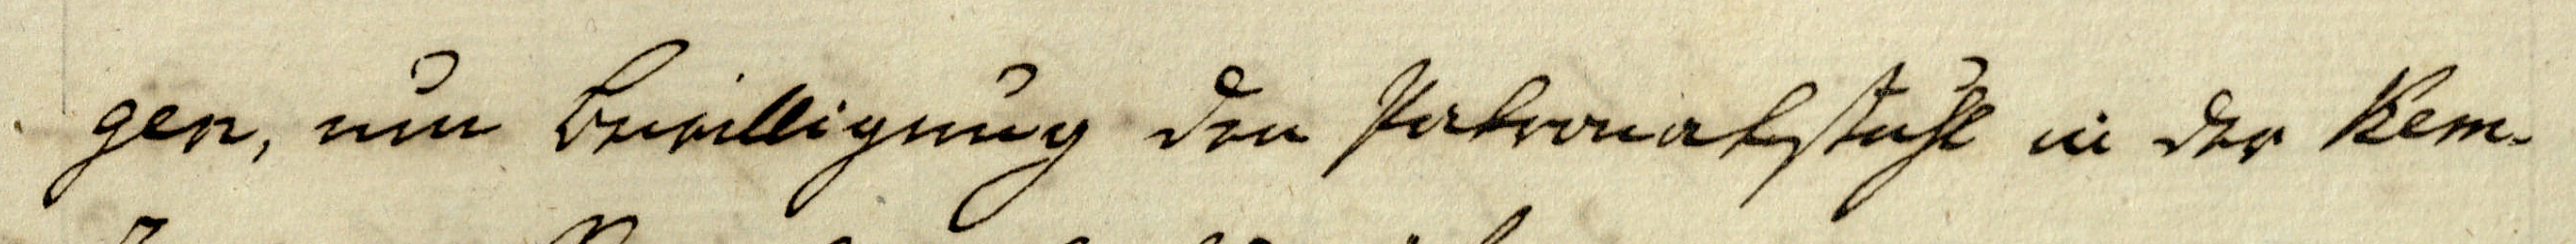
gen, um Bewilligung den Patronatsstuhl in der Kem¬
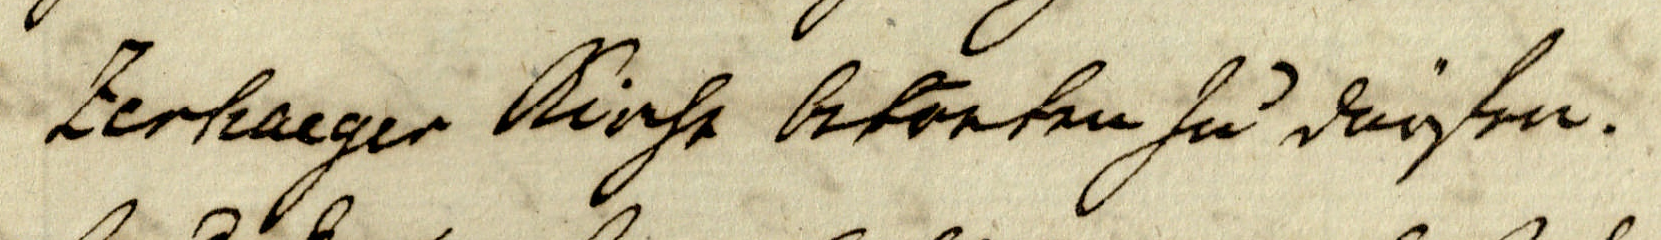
Zerhaeger Kirche betreten zu dürfen.
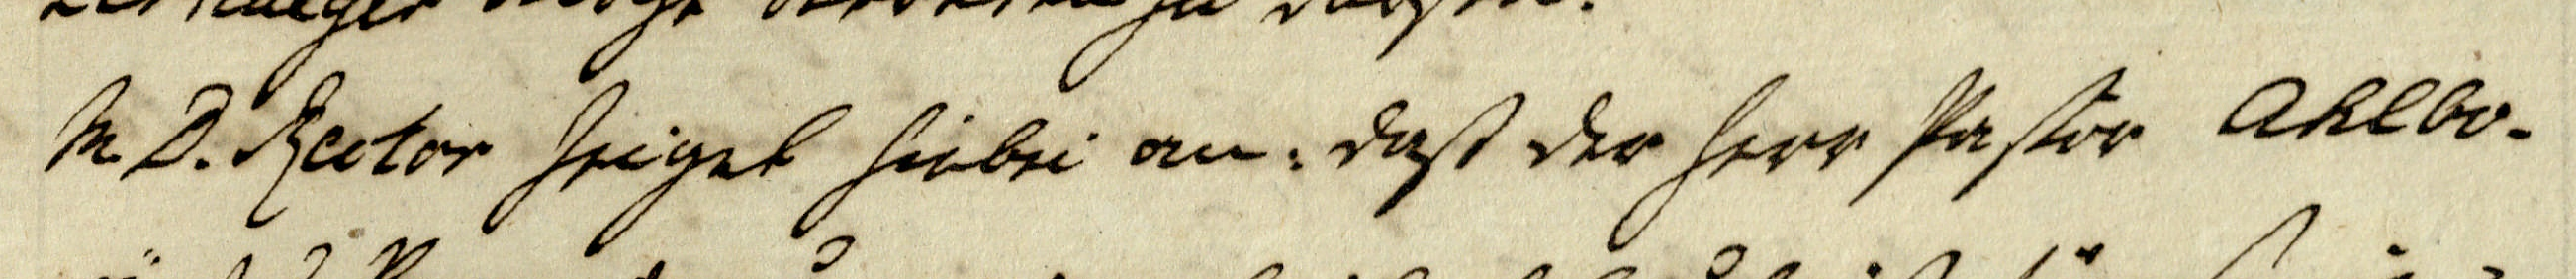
M. D. Rector zeiget hiebei an: daß der Herr Pastor Ahlbo¬
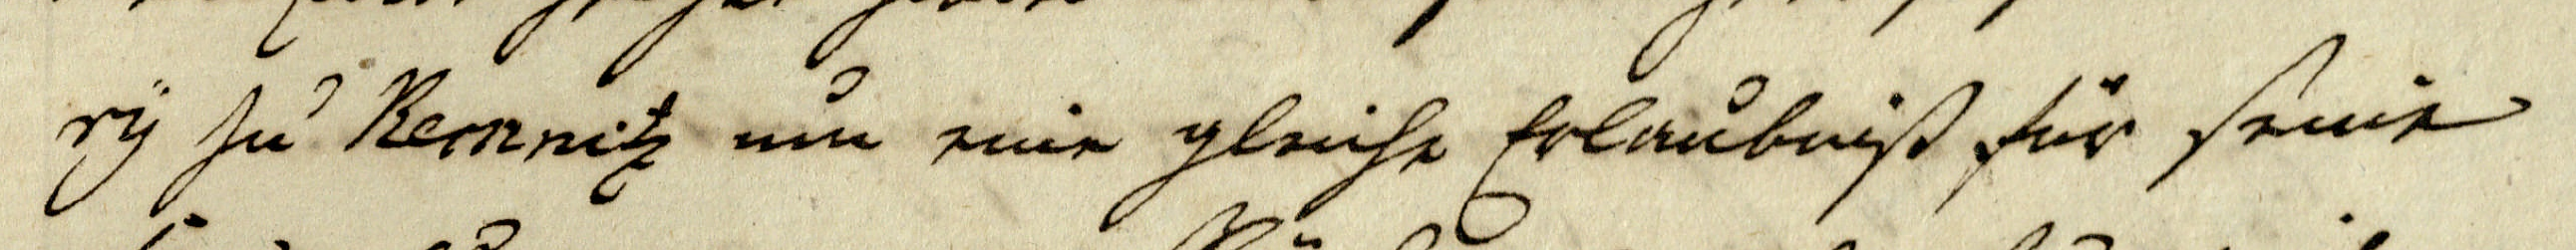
rÿ zu Kemnitz um eine gleiche Erlaubniß für seine
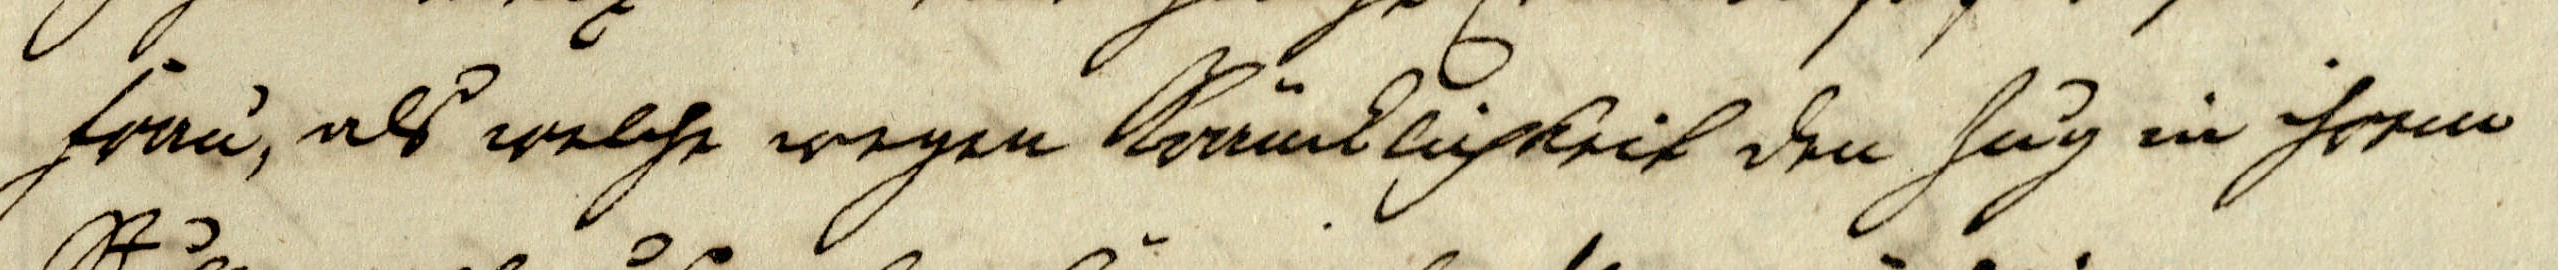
Frau, als welche wegen Kränklichkeit den Zug in ihrem
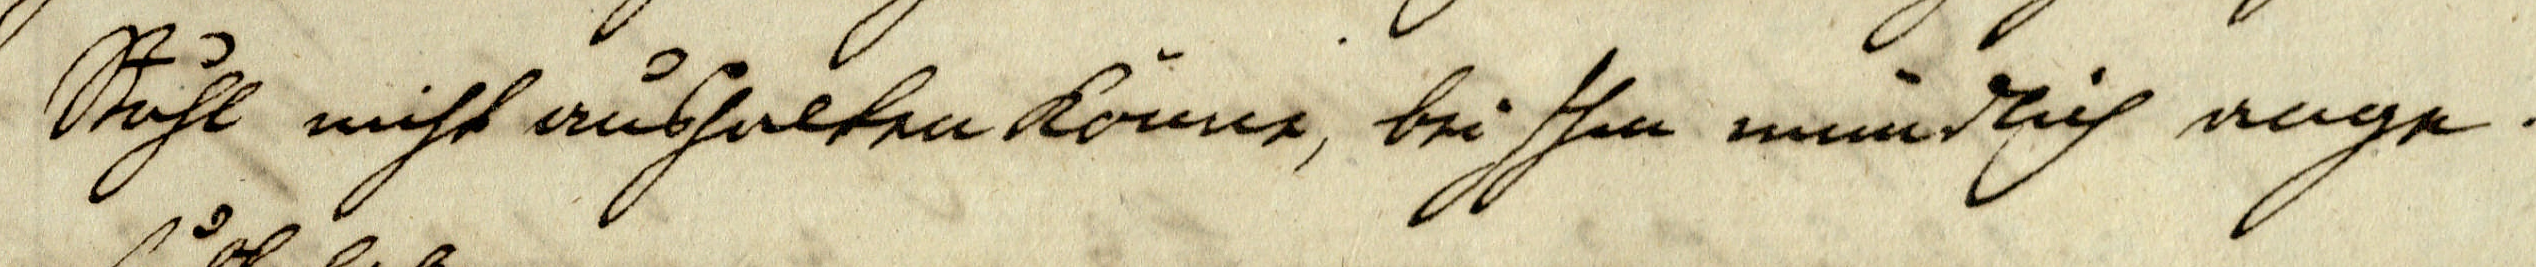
Stuhl nicht aushalten könne, bei Ihm mündlich ange
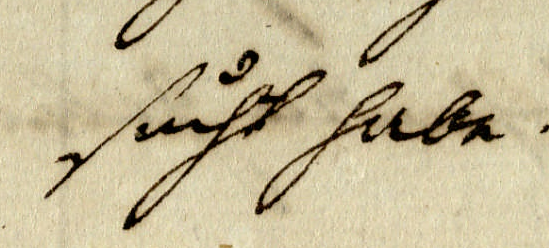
sucht habe.
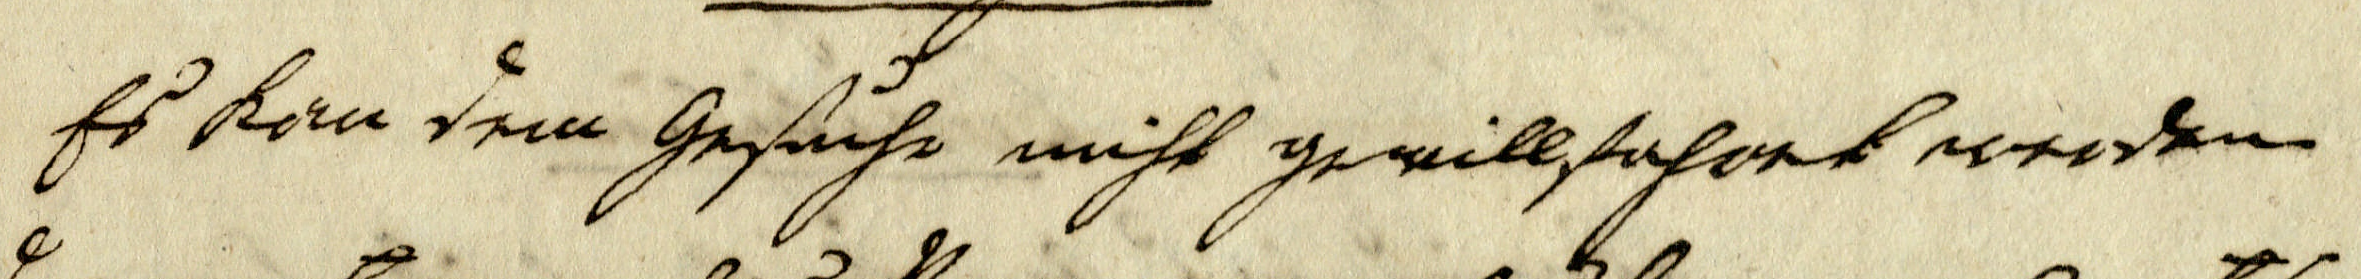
Es kan dem Gesuche nicht gewillfahret werden
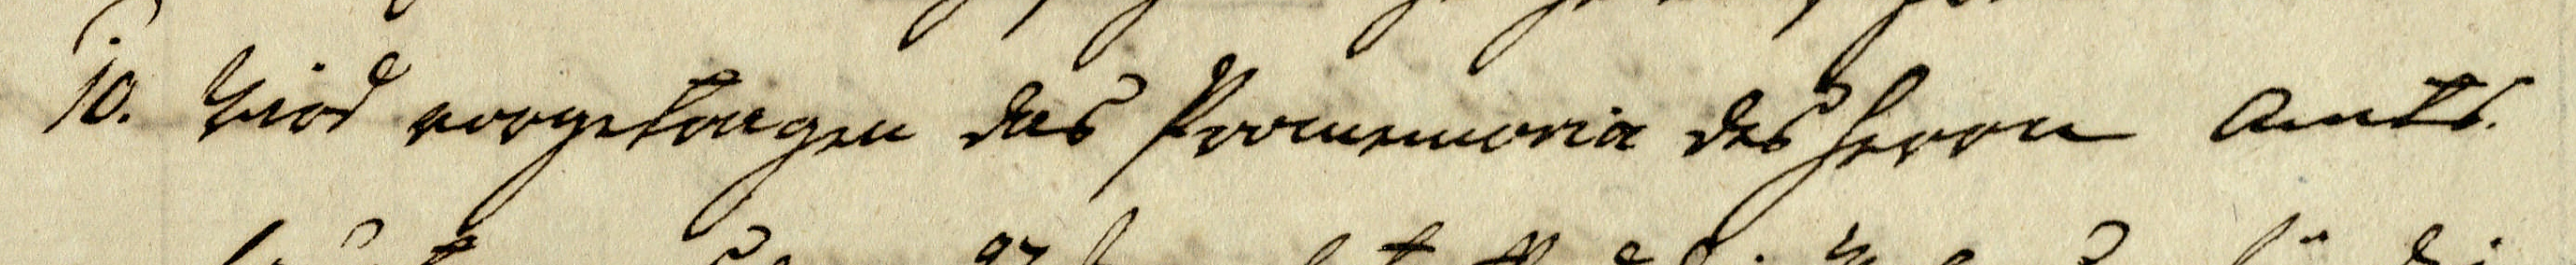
10. Wird vorgetragen das Promemoria des Herrn Amts¬
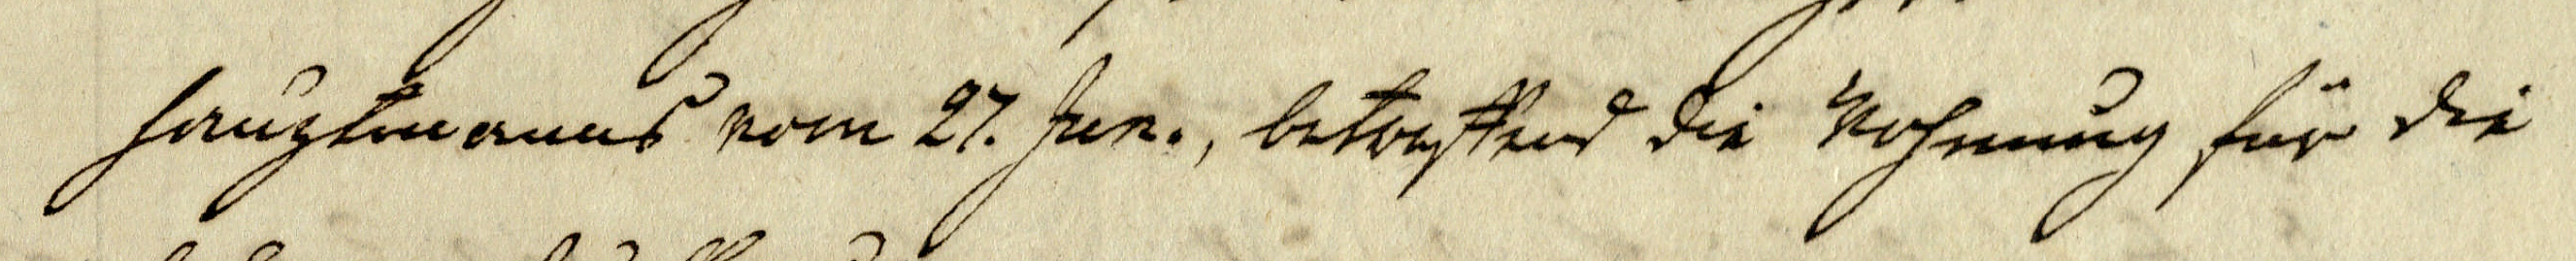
hauptmanns vom 27. Jun., betreffend die Wohnung für die
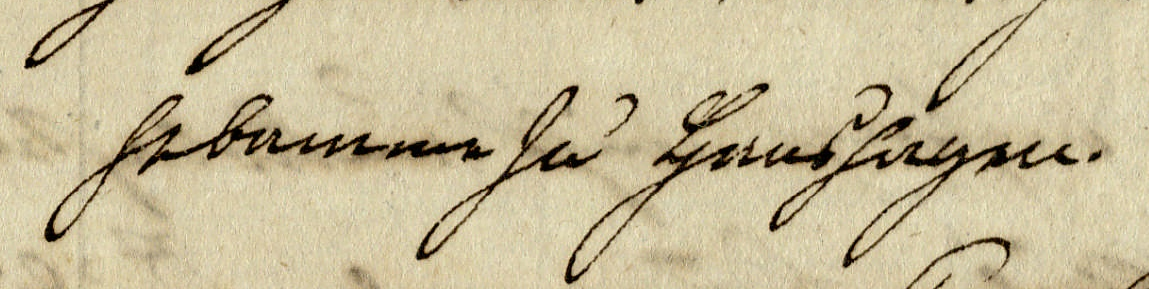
Hebamme zu Hanshagen.
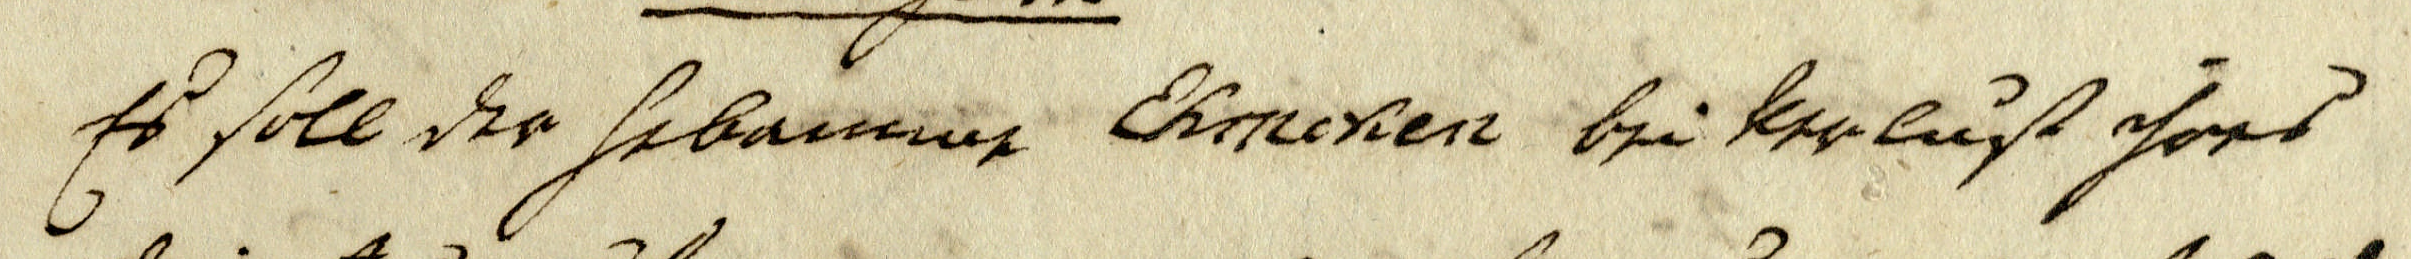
Es soll der Hebamme Ehmcken bei Verlust ihres
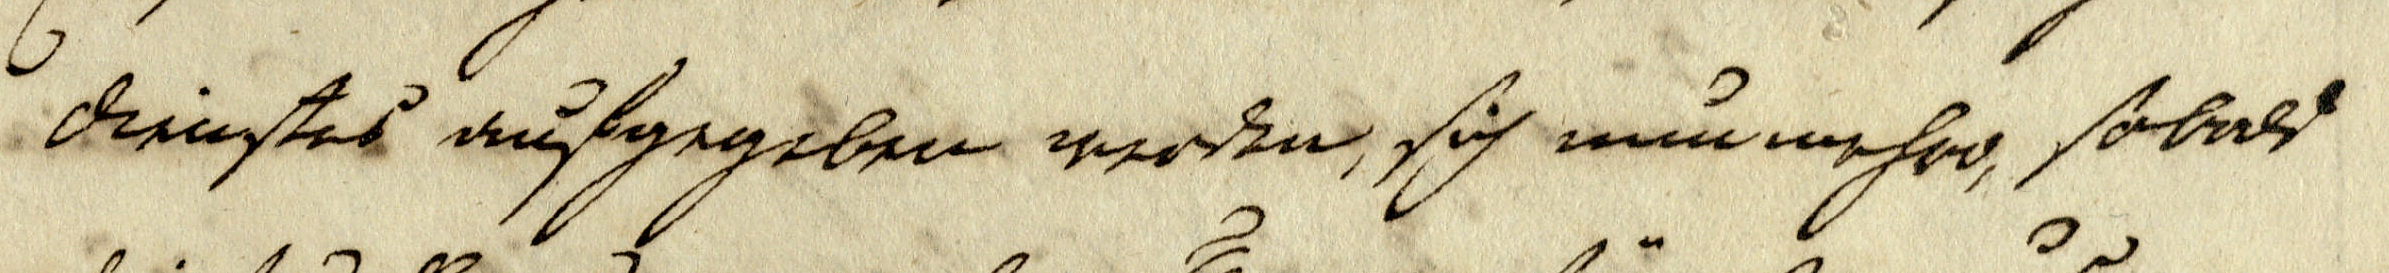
Dienstes aufgegeben werden, sich nunmehro, sobald
